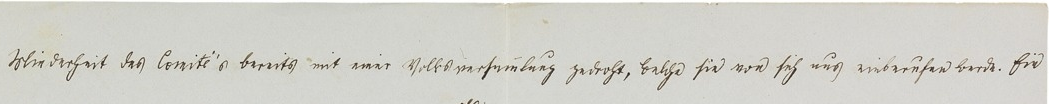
Minderheit des Comité's bereits mit einer Volksversammlung gedroht, welche sie von sich aus einberufen werde. Ein
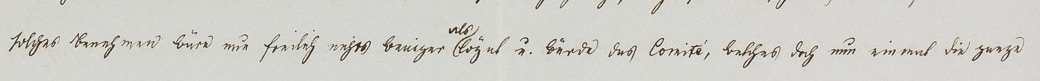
solches Benehmen wäre nun freilich nichts weniger als loyal u. würde des Comité, welches doch nun einmal die ganze
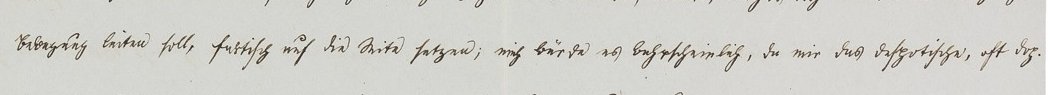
Bewegung leiten soll, faktisch auf die Seite setzen; mich würde es wahrscheinlich, da mir das despotische, oft dop-
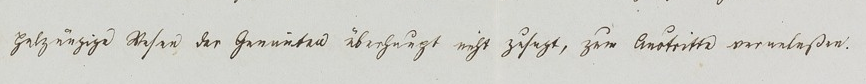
pelzüngige Wesen der Genannten überhaupt nicht zusagt, zum Austritte veranlaßen.
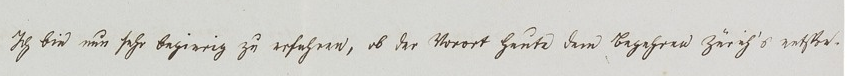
Ich bin nun sehr begierig zu erfahren, ob der Vorort heute dem Begehren Zürich's entspre-
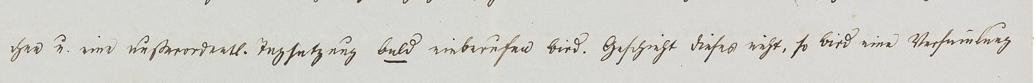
chen u. eine außerordentl. Tagsatzung bald einberufen wird. Geschieht dieses nicht, so wird eine Versammlung
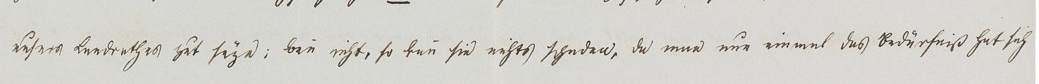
unsers Landrathes gut seyn; wenn nicht, so kann sie nichts schaden, da man nun einmal das Bedürfniß hat sich
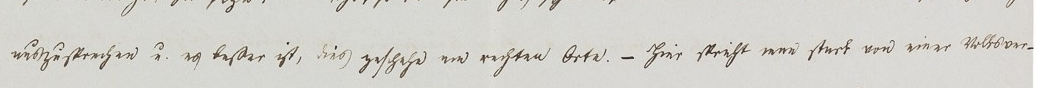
auszusprechen u. es beßer ist, dies geschehe am rechten Orte. – Hier spricht man stark von einer Volksver-
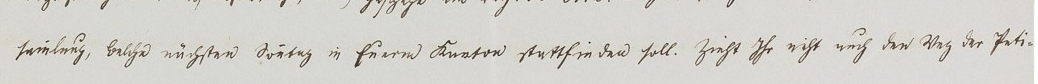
sammlung, welche nächsten Sonntag in Euerm Kanton stattfinden soll. Zieht Ihr nicht auch den Weg der Peti-
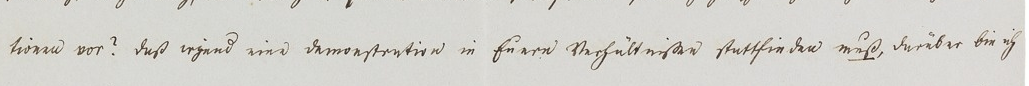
tionen vor? Daß irgend eine Demonstration in Euern Verhältnißen stattfinden muß, darüber bin ich
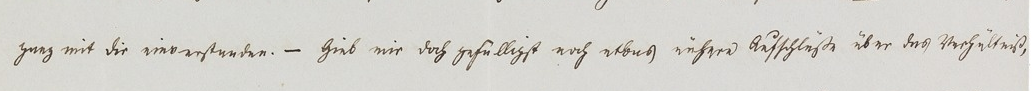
ganz mit dir einverstanden. – Gieb mir doch gefälligst noch etwas nähere Aufschlüße über das Verhältniß,
